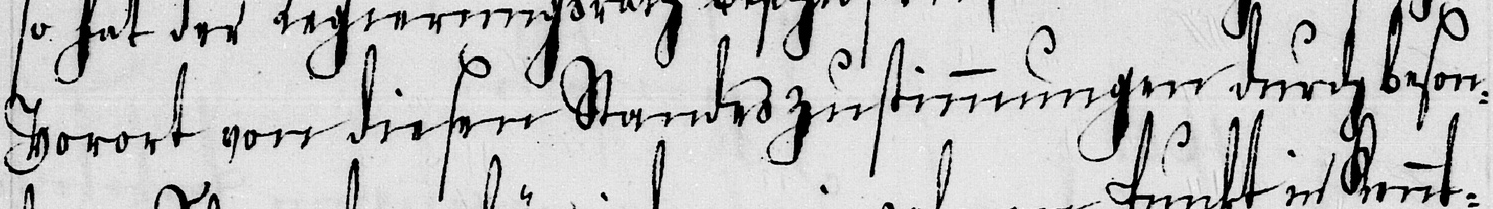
Vorort von diesen Standeszustimmungen durch beson¬
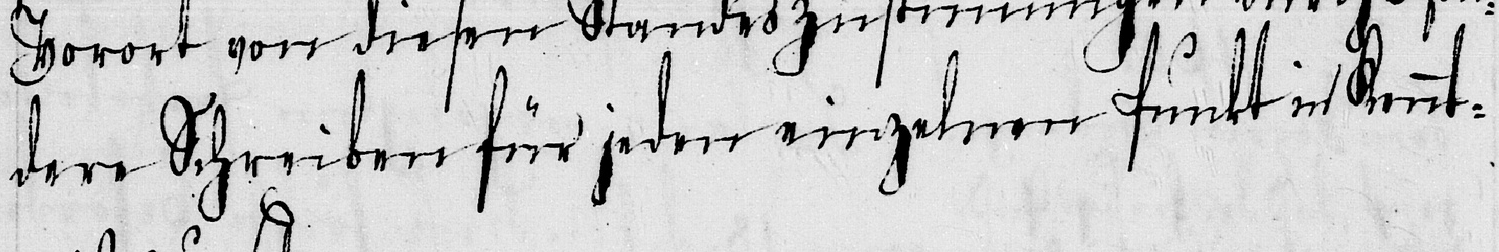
dere Schreiben für jeden einzelnen Punkt in Kennt¬
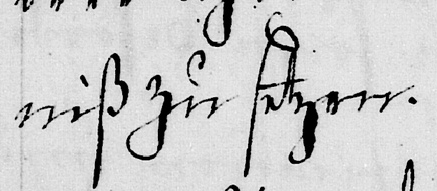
niß zu setzen.
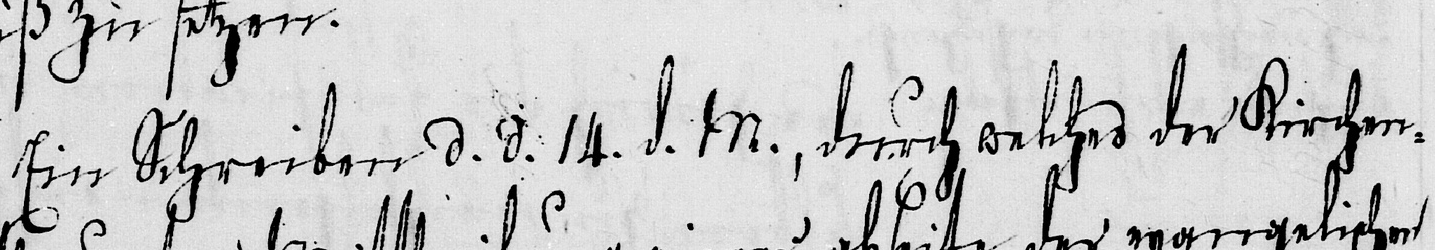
Ein Schreiben d. d. 14. d. M., durch welches der Kirchen¬
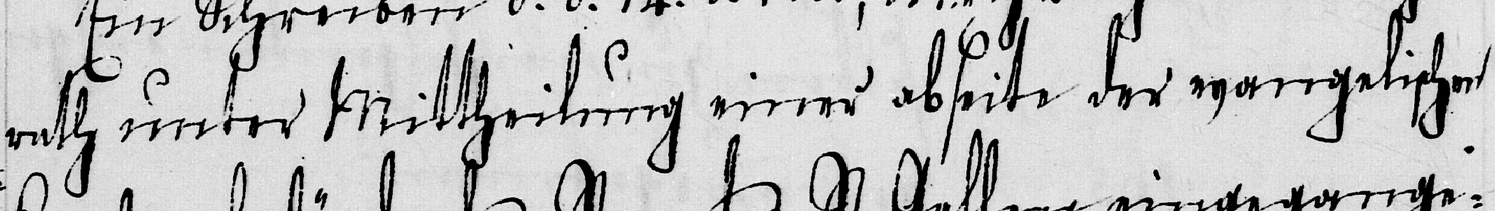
rath unter Mittheilung einer abseite der evangelischen
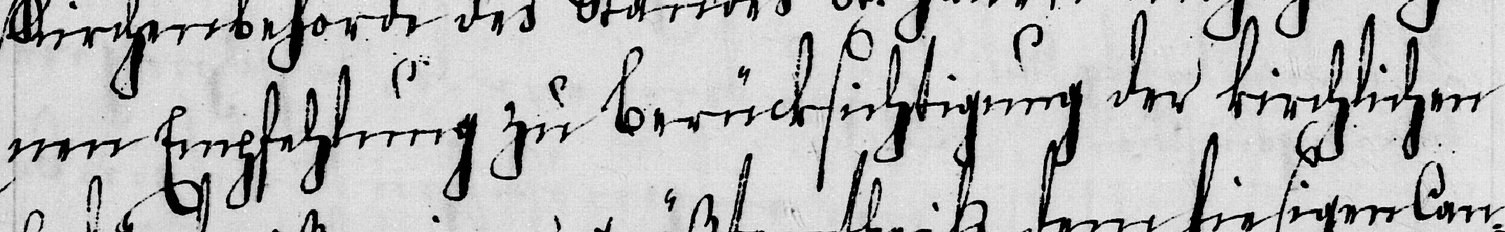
nen Empfehlung zu Berücksichtigung der kirchlichen
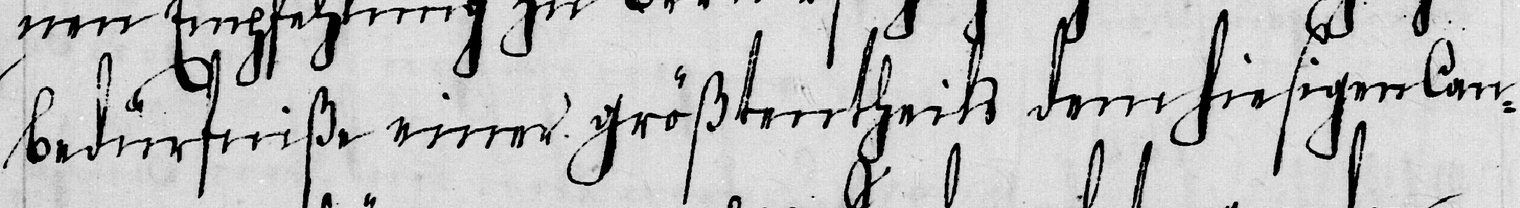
Bedürfniße einer größtentheils dem hiesigen Can¬
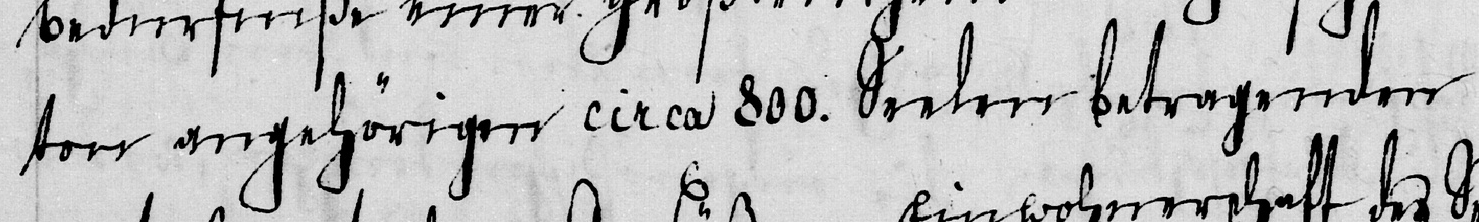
ton angehörigen circa. 800. Seelen betragenden
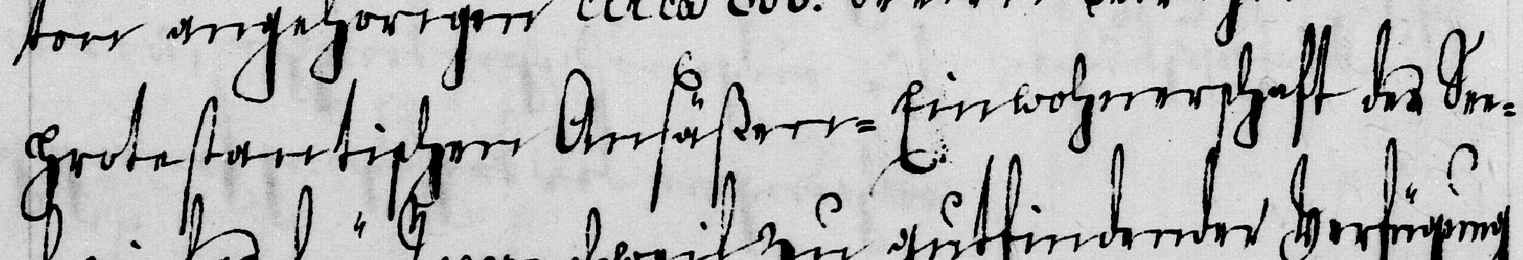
protestantischen Ansäßen-Einwohnerschaft des Se¬
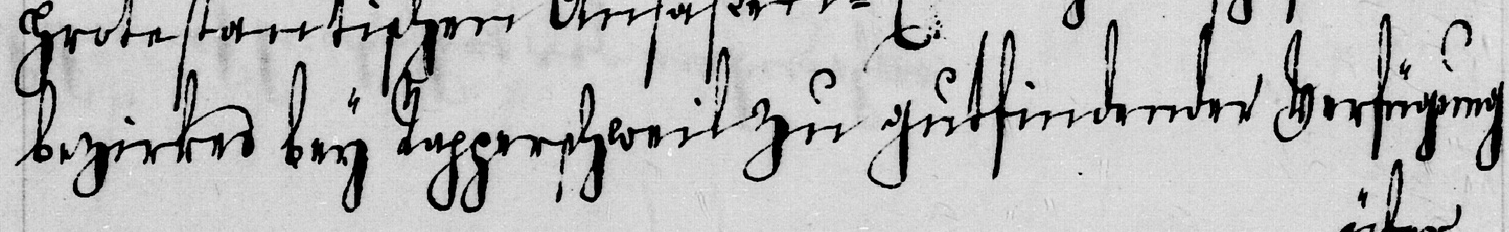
ebezirkes bey Rapperschweil zu gutfindender Verfügung
